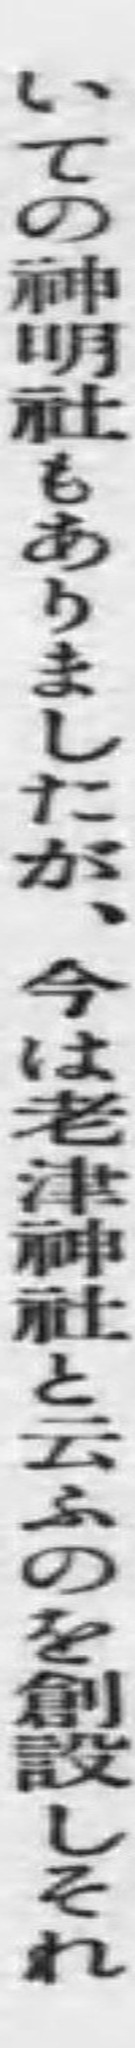いての神明社もありましたが、今は老津神社と云ふのを創設しそれ
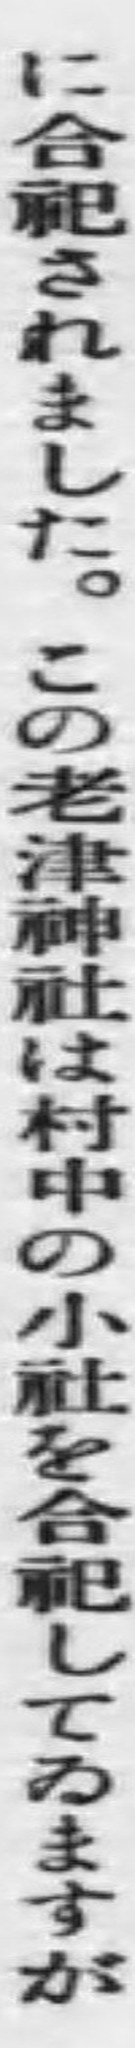に合祀されました。この老津神社は村中の小社を合祀してゐますが
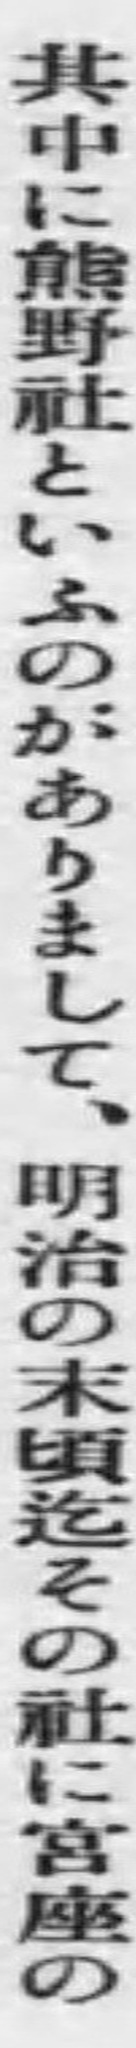其中に熊野社といふのがありまして、明治の末頃迄その社に宮座の
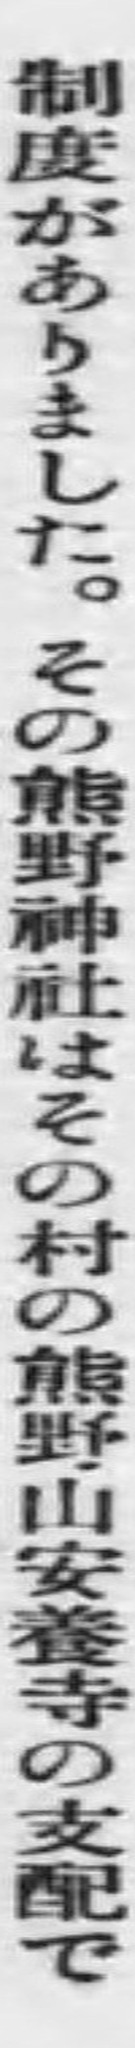制度がありました。その熊野神社はその村の熊野山安養寺の支配で
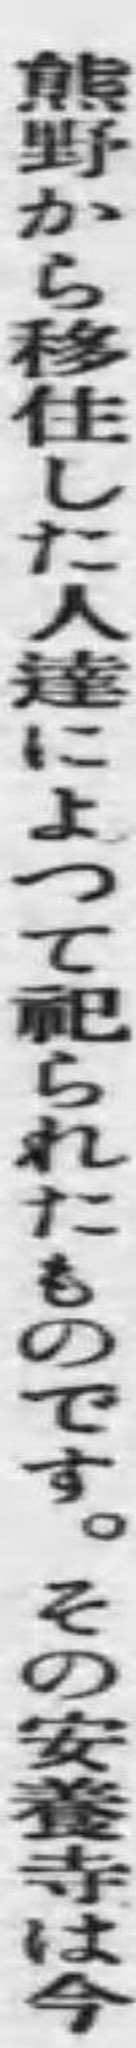熊野から移住した人達によつて祀られたものです。その安養寺は今
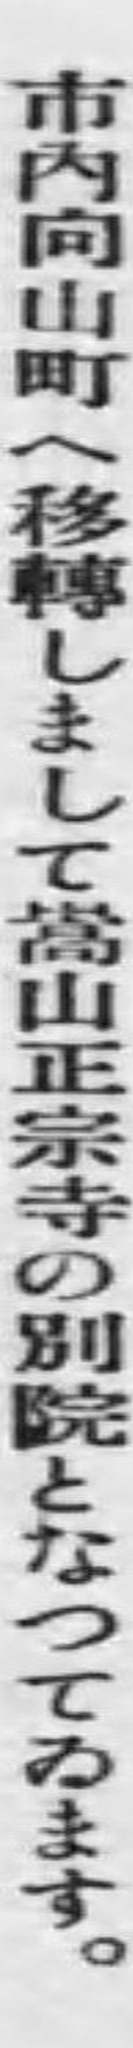市内向山町へ移転しまして嵩山正宗寺の別院となつてゐます。
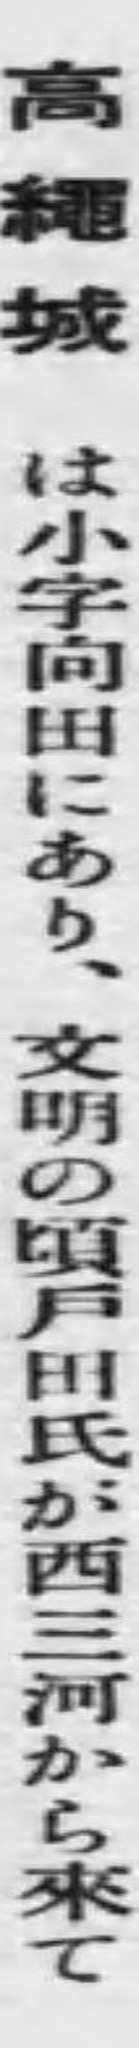高縄城は小字向田にあり、文明の頃戸田氏が西三河から来て
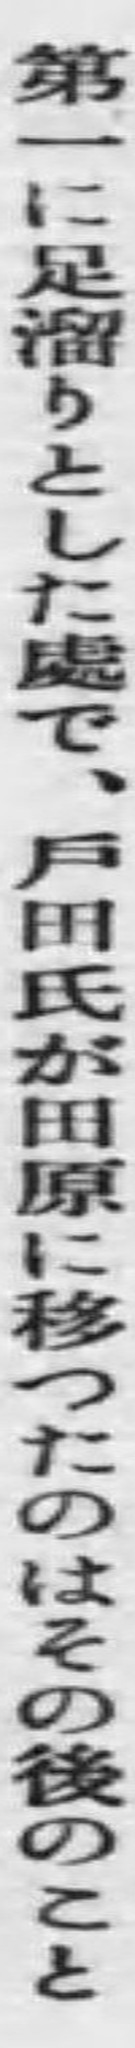第一に足溜りとした処で、戸田氏が田原に移つたのはその後のこと
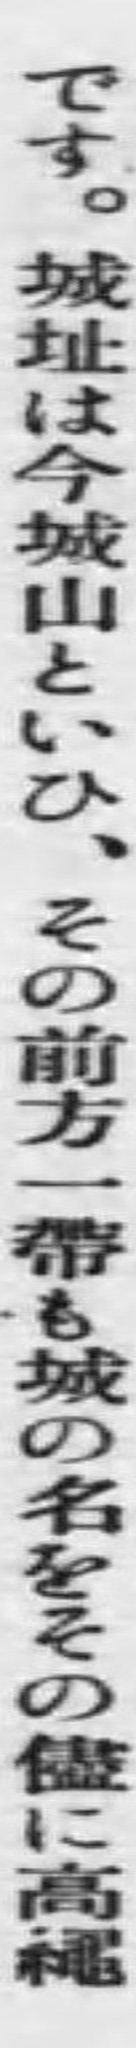です。城址は今城山といひ、その前方一帯も城の名をその侭に高縄
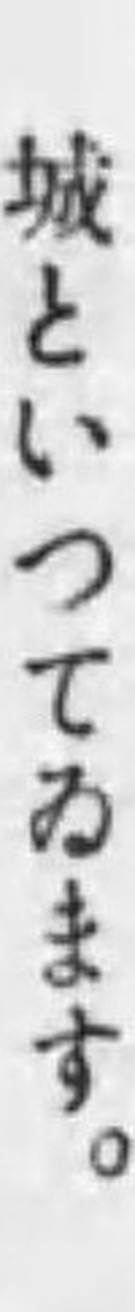城といつてゐます。
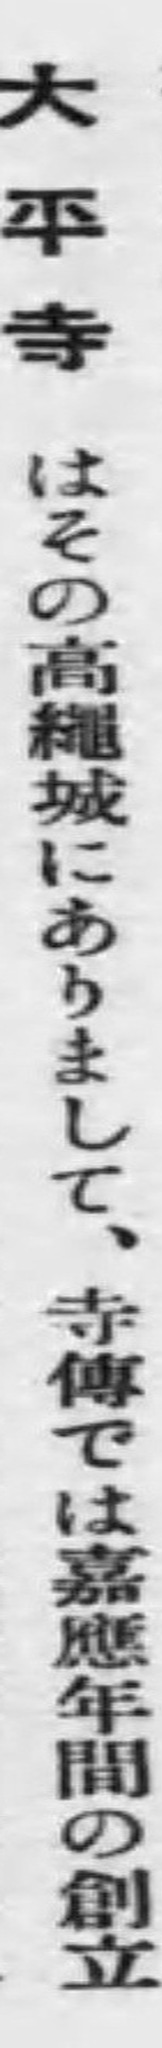大平寺はその高縄城にありまして、寺伝では嘉応年間の創立
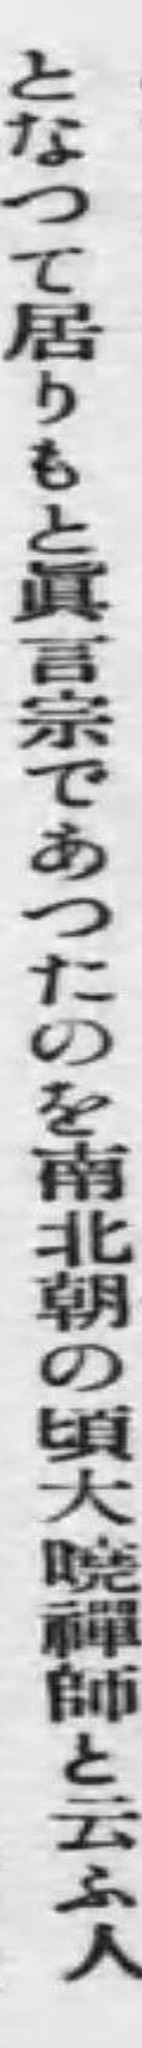となつて居りもと真言宗であつたのを南北朝の頃大暁禅師と云ふ人
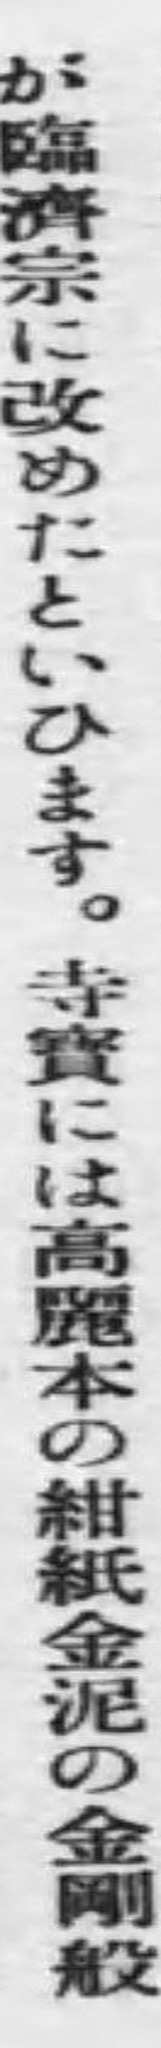が臨済宗に改めたといひます。寺宝には高麗本の紺紙金泥の金剛般
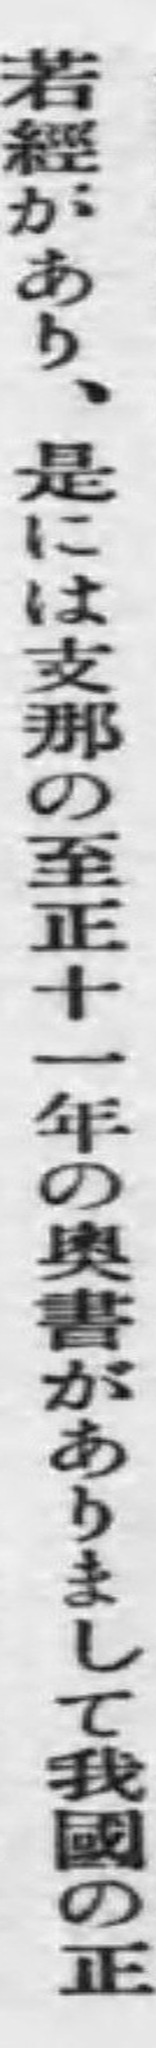若経があり、是には支那の至正十一年の奥書がありまして我国の正
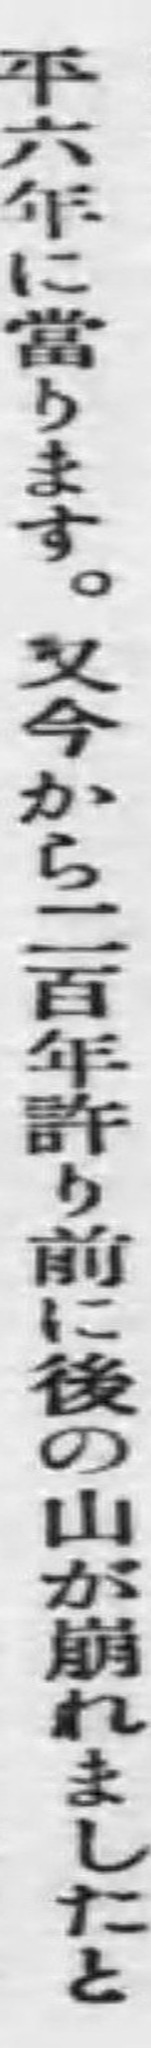平六年に当ります。又今から二百年許り前に後の山が崩れましたと
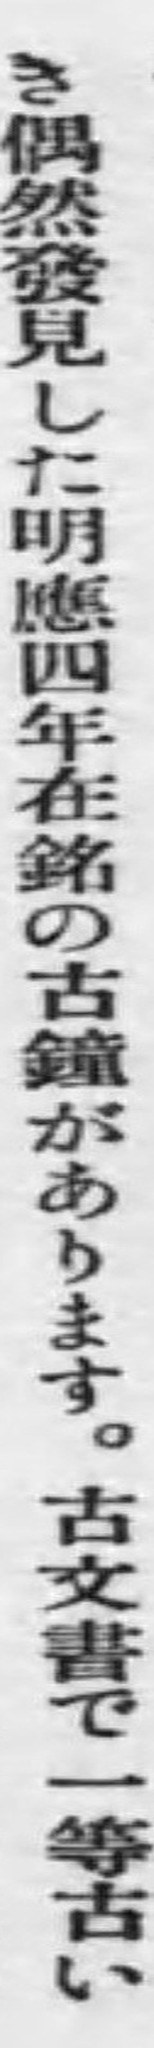き偶然発見した明応四年在銘の古鐘があります。古文書で一等古い
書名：東三河道中記 : 豊橋市及其附近案内
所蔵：国立国会図書館 National Diet Library, JAPAN
